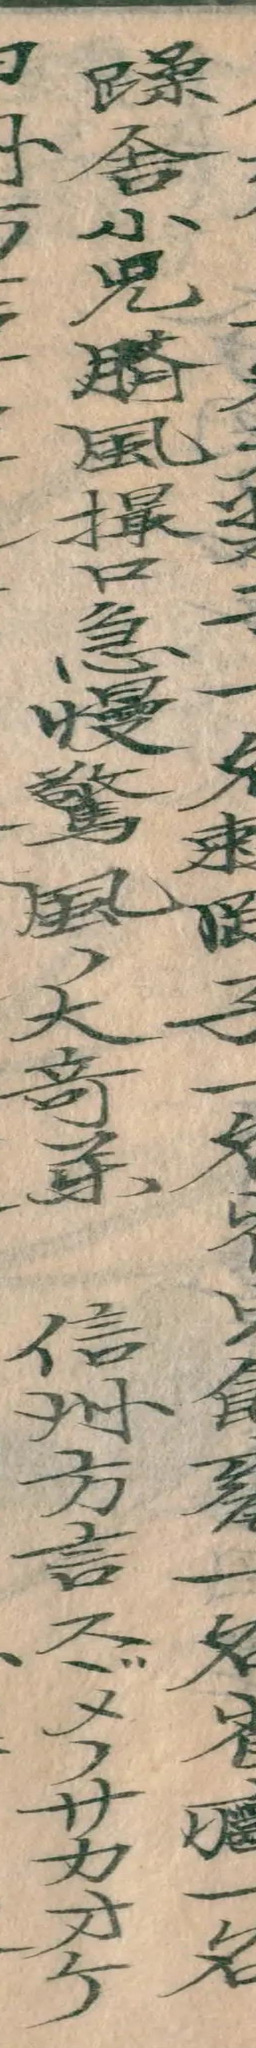躁舎小児臍風撮口急慢驚風ノ大奇薬信州方言スヾメノサカオケ
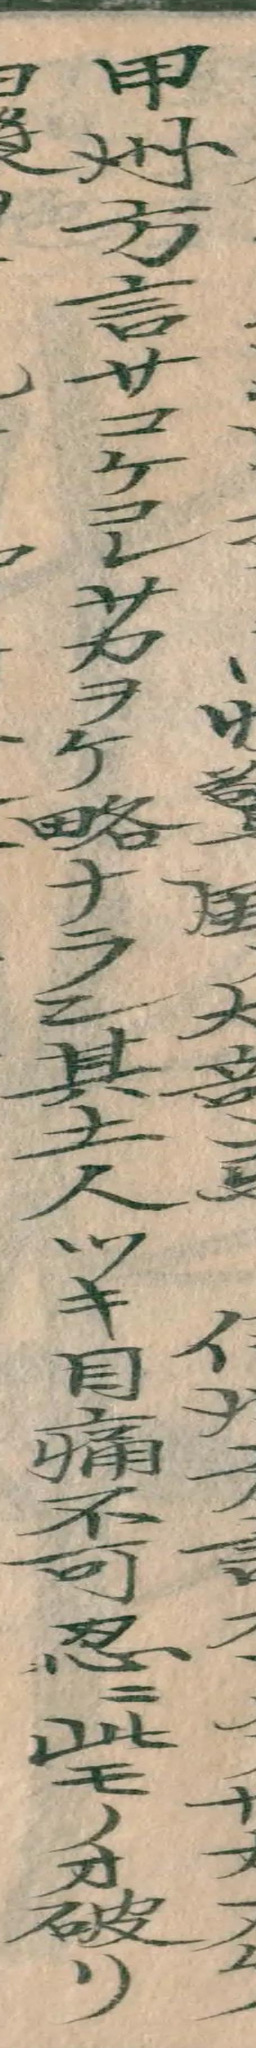甲州方言サコケコレサカヲケ略ナラン其土人ツキ目痛不可忍ニ此モノオ破リ
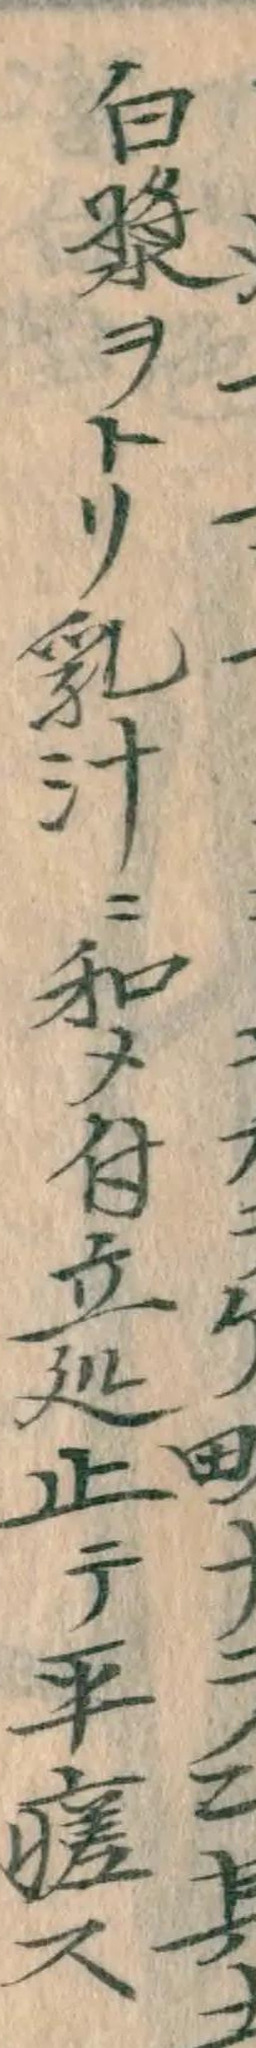白漿ヲトリ乳汁ニ和シテ付立処止テ平瘥ス

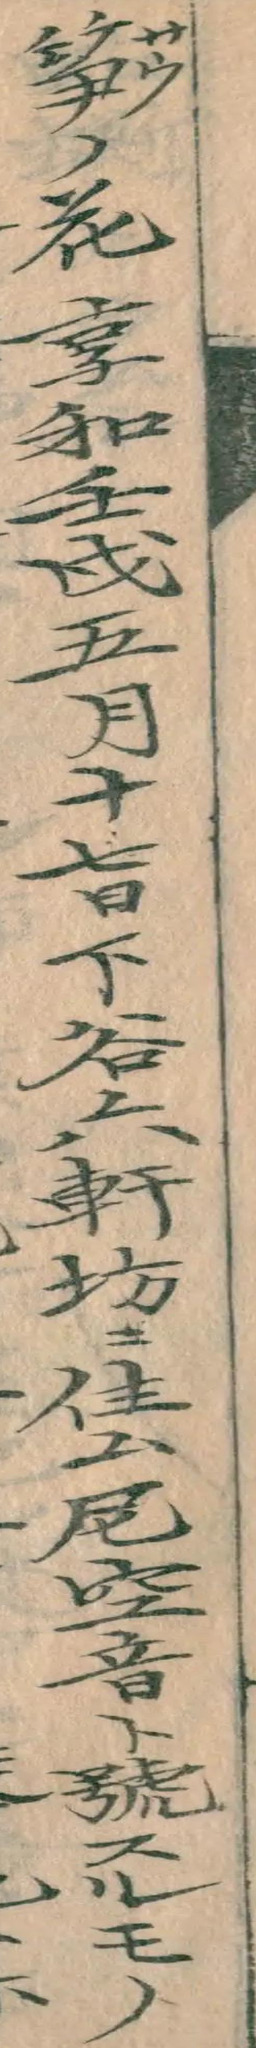笋ノ花享和壬戌五月十七日下谷六軒坊ニ住ム尼空音ト號スルモノ
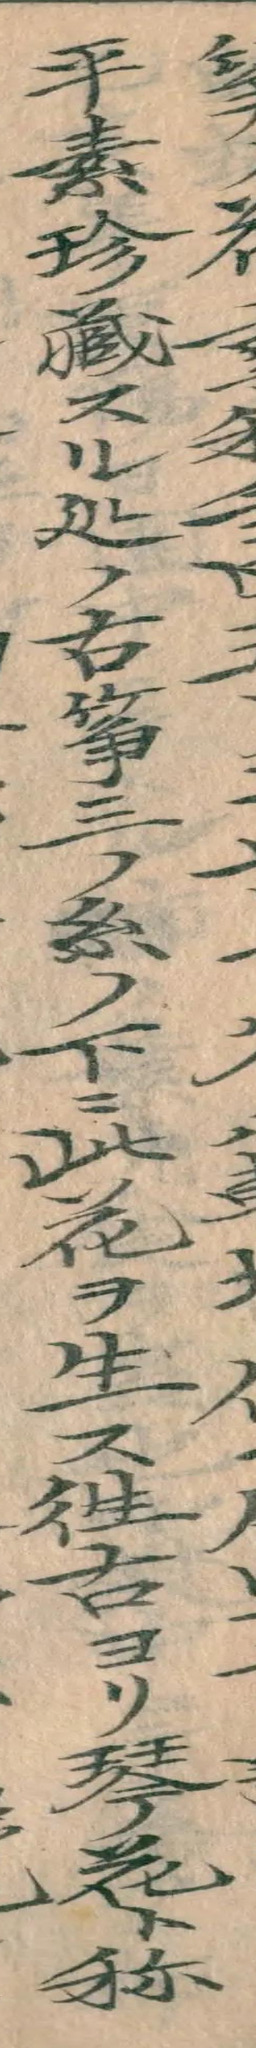平素珍蔵スル処ノ古笋三糸ノ下ニ此花ヲ生ス往古ヨリ琴花ト称
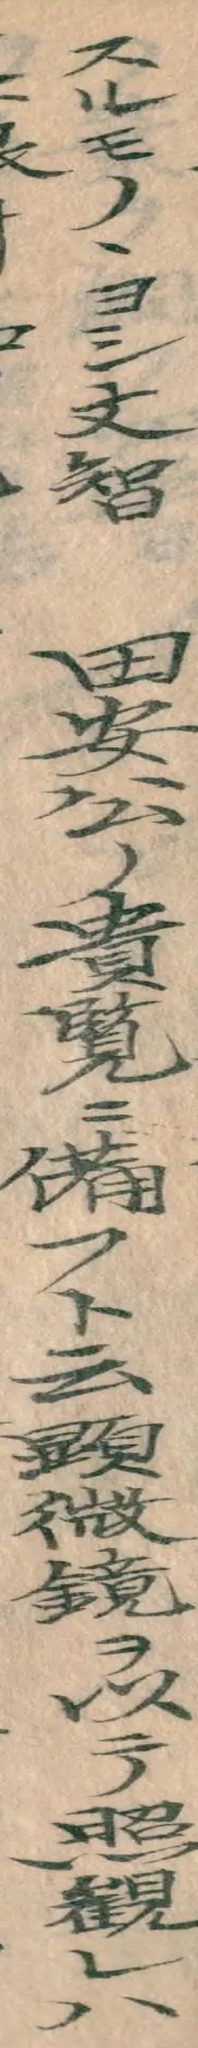スルモノヽヨシ文智田安公ノ貴覧ニ備フト云顕微鏡ヲ以テ照観レハ
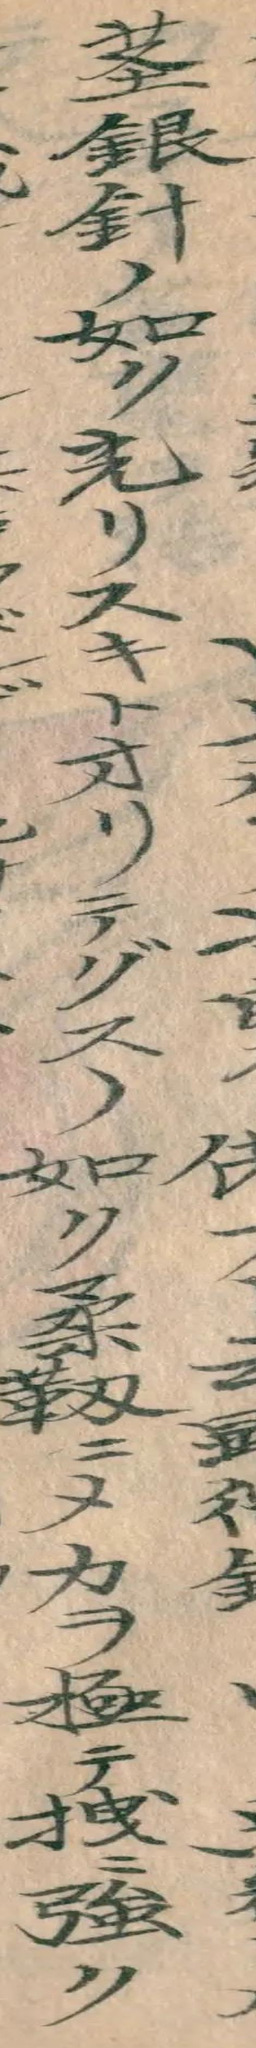茎銀針ノ如ク光リスキトオリテグスノ如ク柔靭ニシテ力ヲ極テ拽ニ強ク
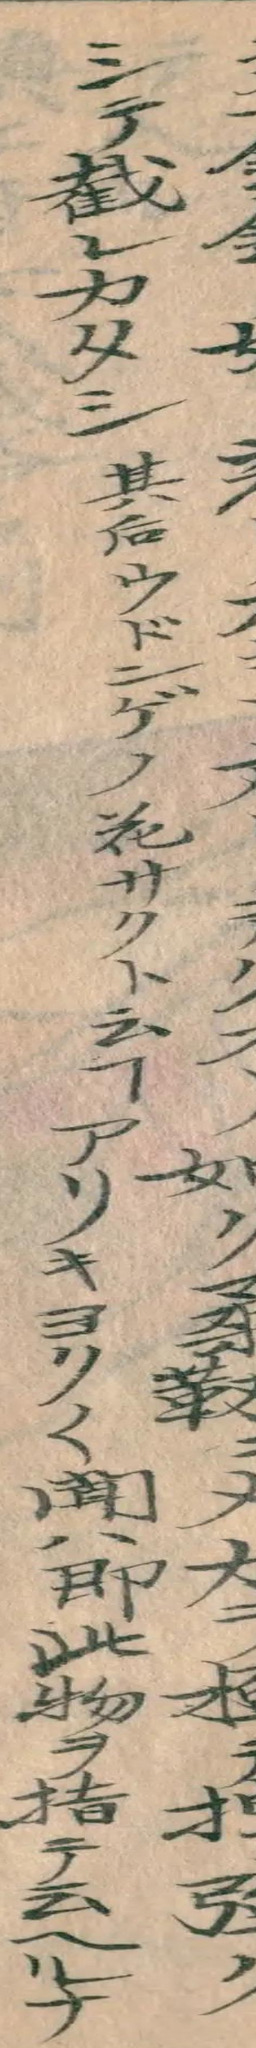シテ截レカタシ其后ウドンゲノ花サクト云コトアリキヨク〱聞ハ即此物ヲ指テ云ヘルナ
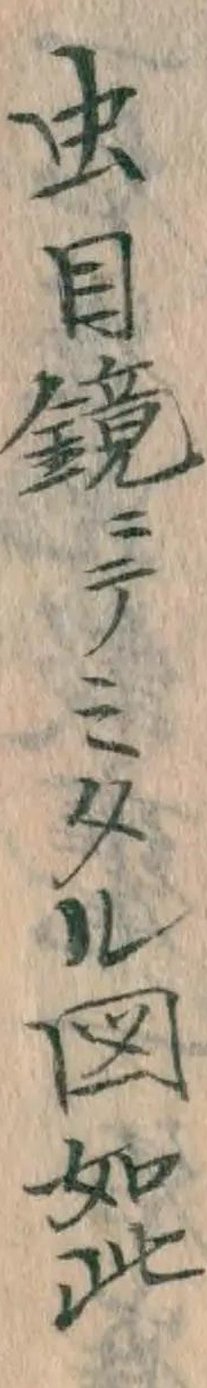虫目鏡ニテ見タル図如此
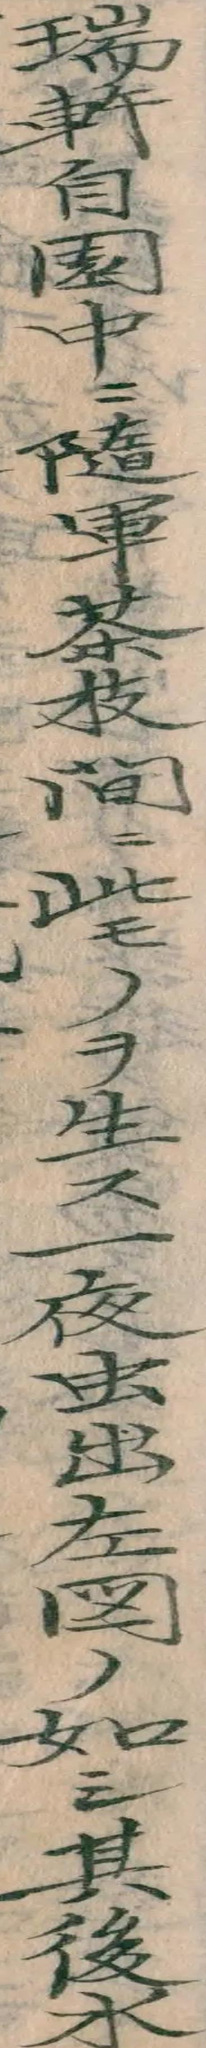瑞軒自園中ニ隨軍茶枝間ニ此モノヲ生ス一夜虫出左図ノ如シ其後水
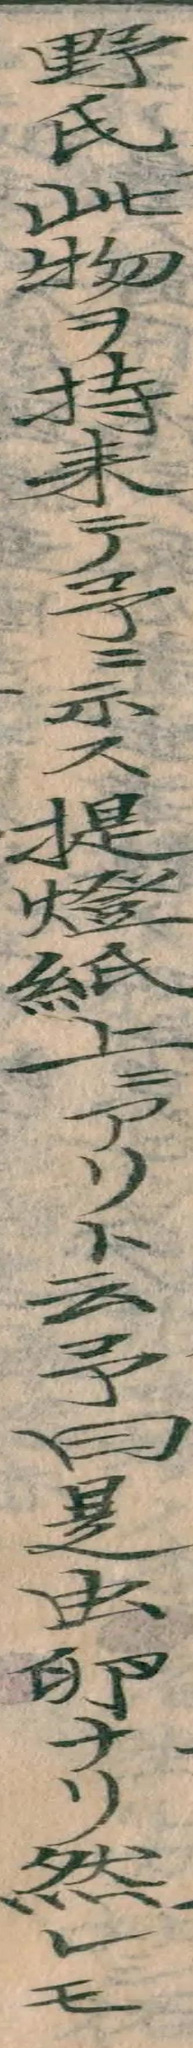野氏此物ヲ持来テ予ニ示ス提燈紙上ニアリト云予曰是虫卵ナリ然レモ
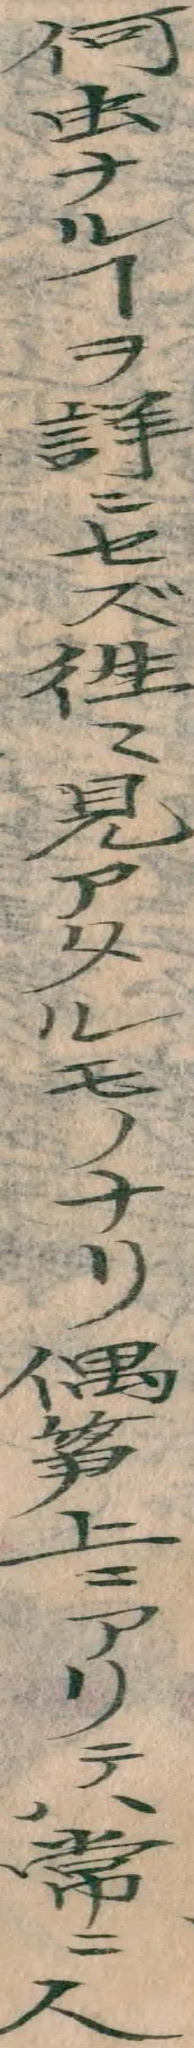何虫ナルコトヲ詳ニセズ往々見アタルモノナリ偶笋上ニアリテハ常ニ人
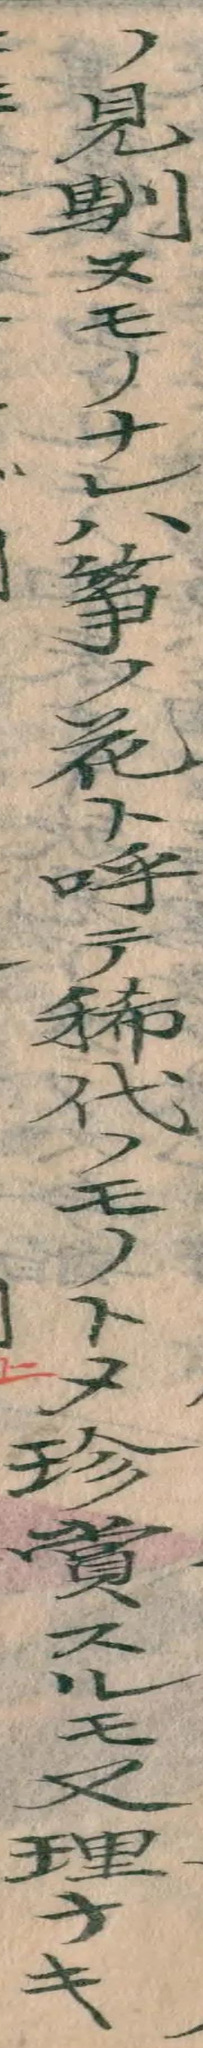ノ見馴ヌモノナレハ笋ノ花ト呼テ稀代ノモノトシテ珍賞スルモ又理ナキ
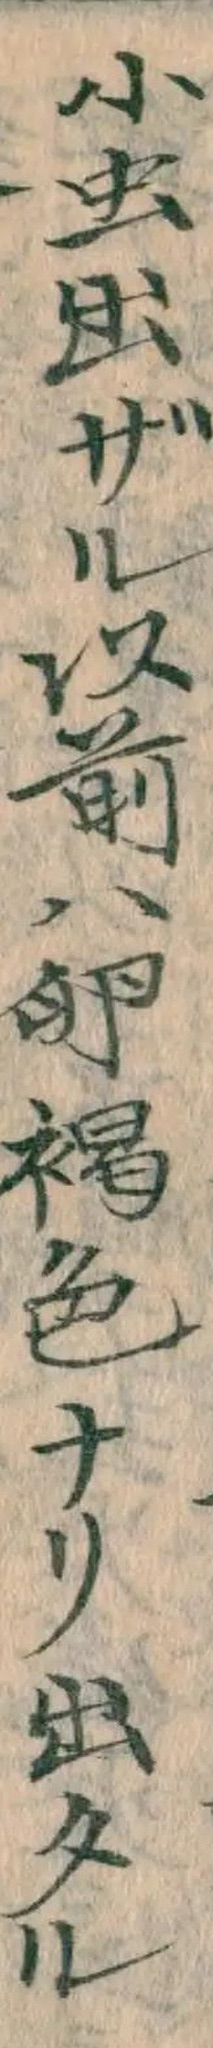小虫出ザル以前ハ卵褐色ナリ出タル
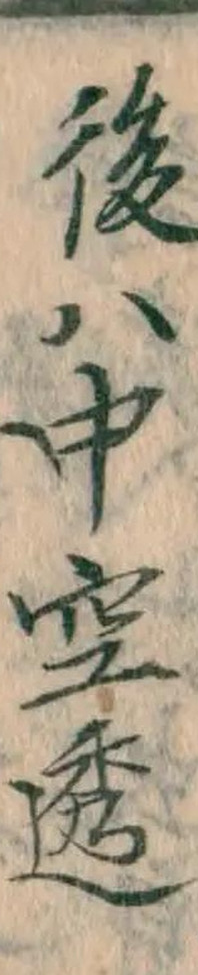後ハ中空透
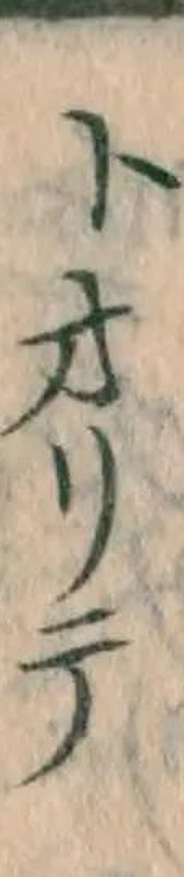トオリテ
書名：千蟲譜 3巻. [3]
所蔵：国立国会図書館 National Diet Library, JAPAN
